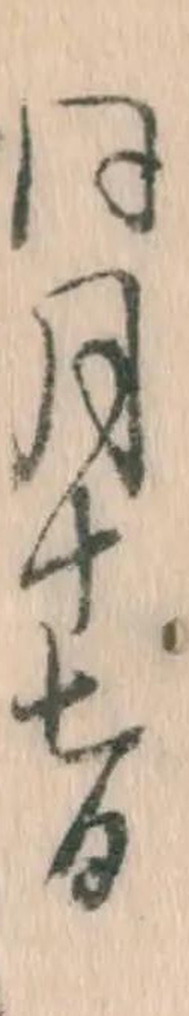同月十九日

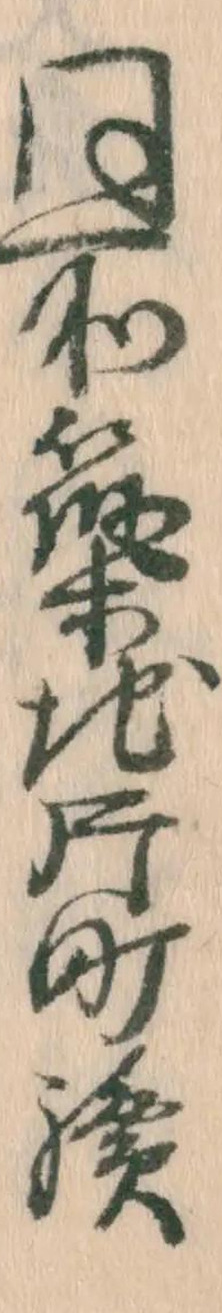同所築地片町続
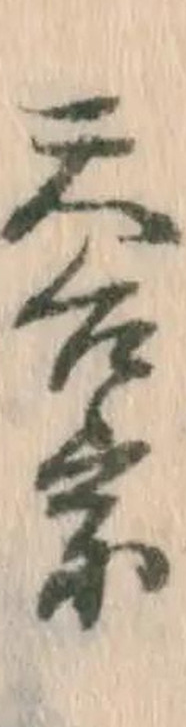天台宗
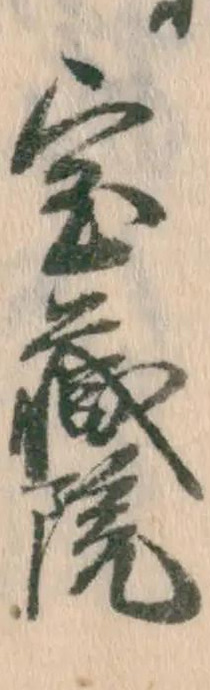宝蔵院
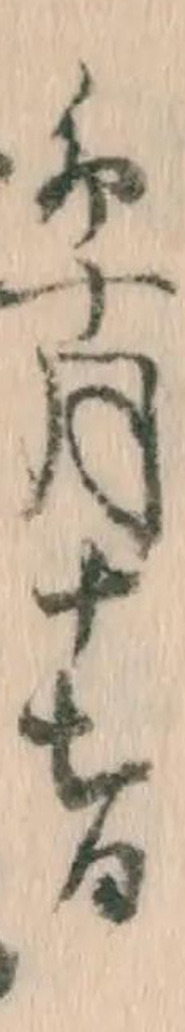卯十月十七日
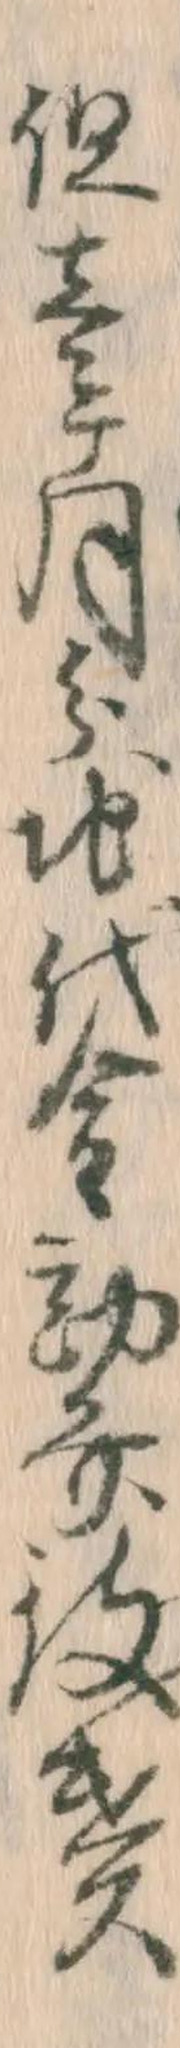但壱月分地代金勘弁致遣ス
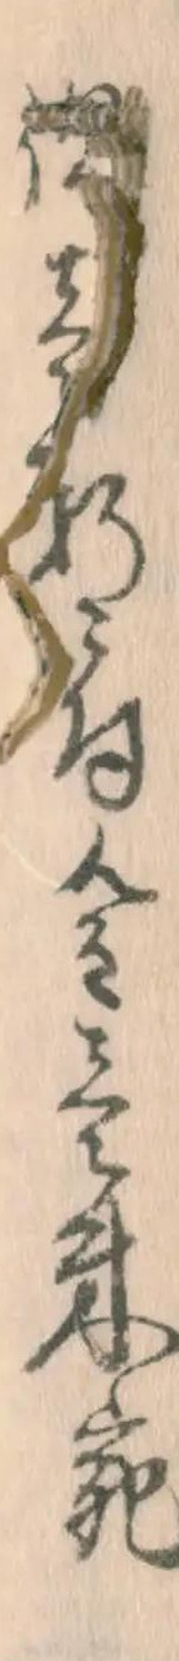但壱軒ニ付金壱朱宛
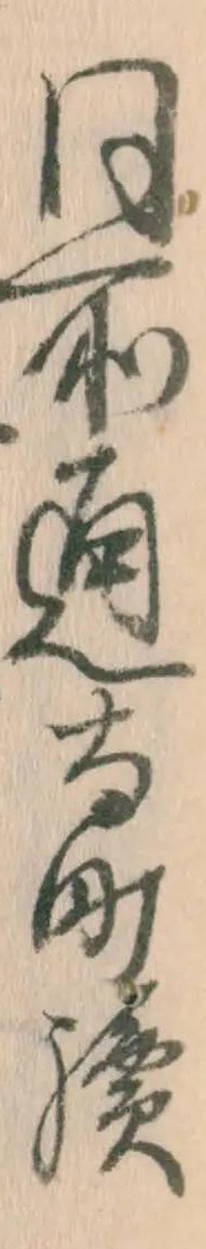同所通寺町続
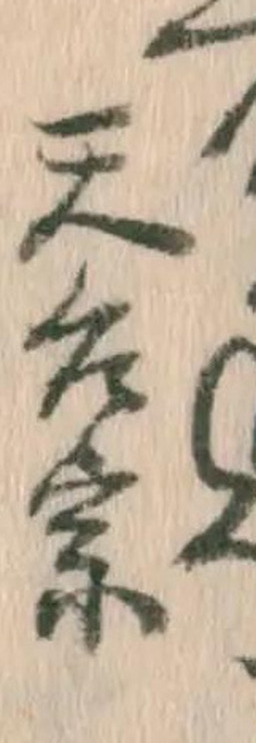天台宗
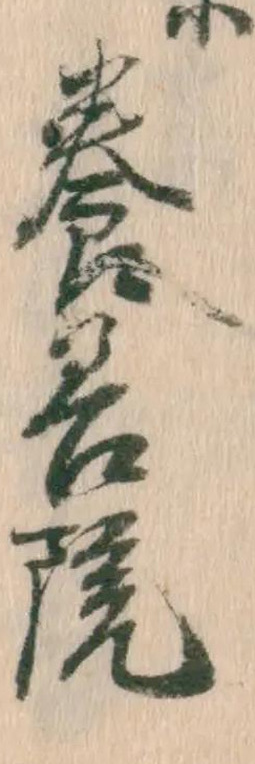養善院
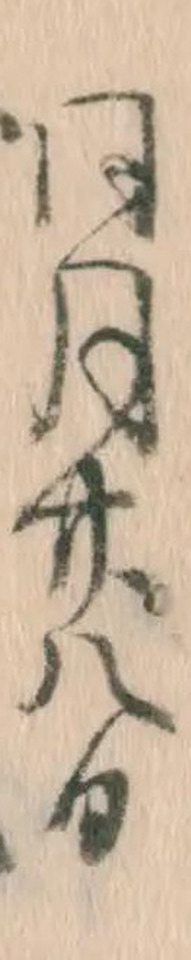同月廿八日
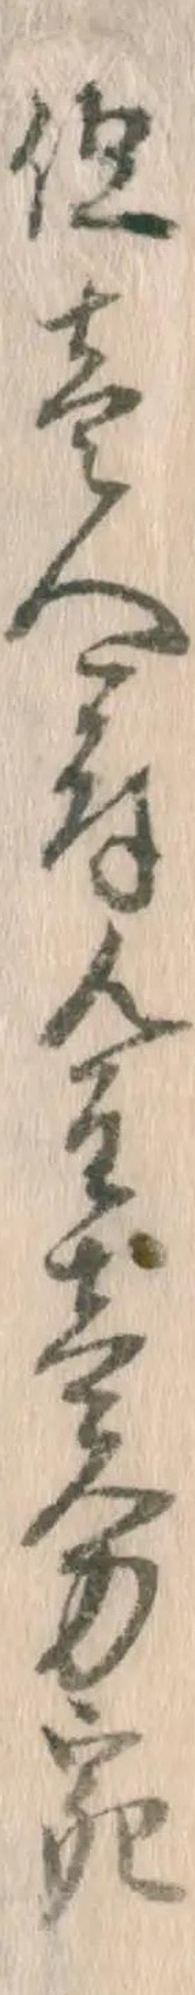但壱人ニ付金壱分宛
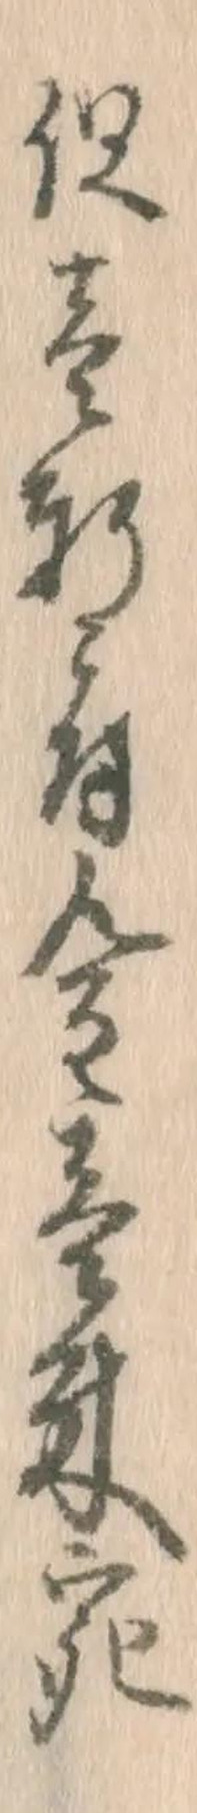但壱軒ニ付金壱朱宛

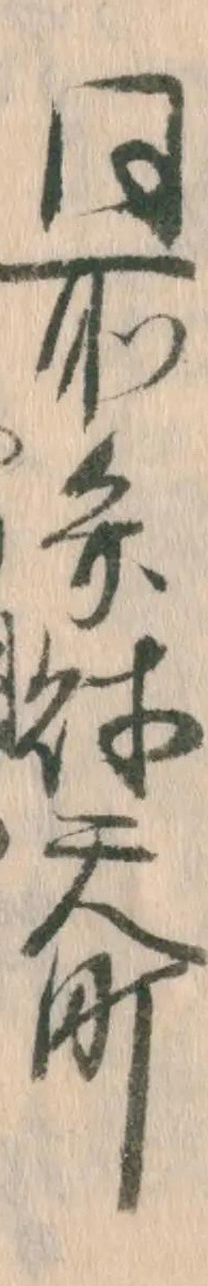同所弁財天町
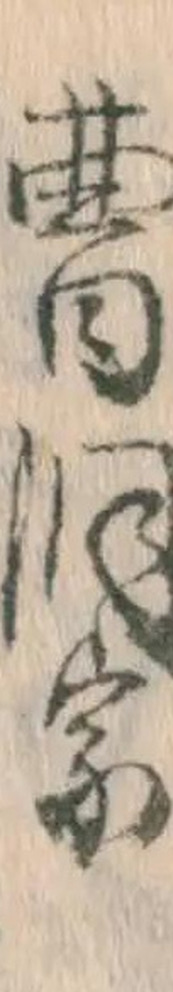曹洞宗
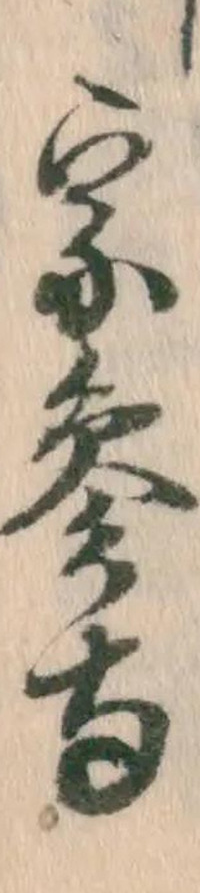宗参寺
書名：武家方并寺院等ニテ施差出候一件
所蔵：国立国会図書館 National Diet Library, JAPAN
